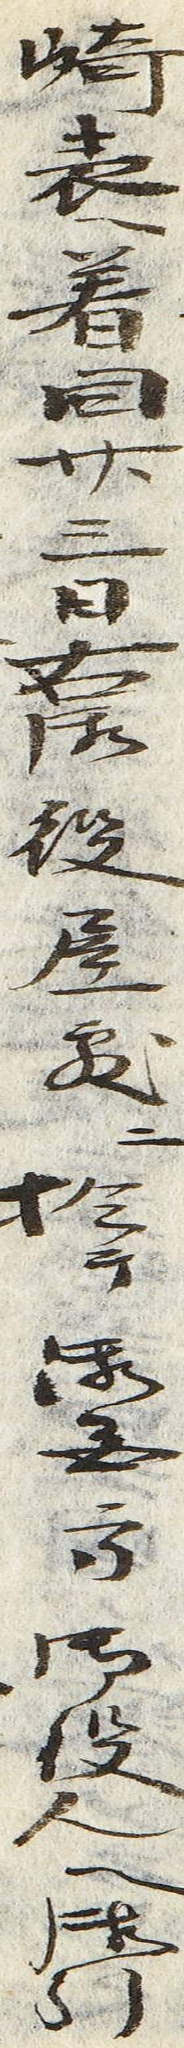崎表ヘ着同廿三日右御役屋敷ニ於テ御方御役人ヘ御引
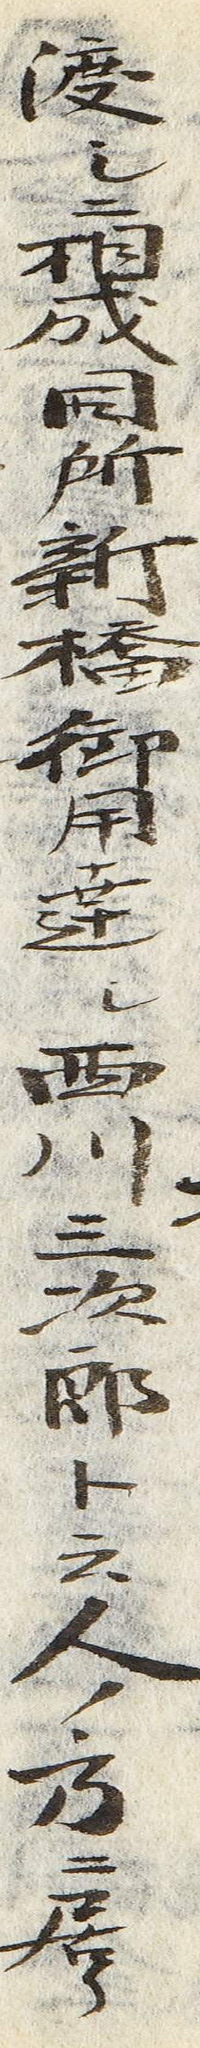渡シニ相成同所新橋御用達シ西川三次郎ト云人ノ方ニ居リ
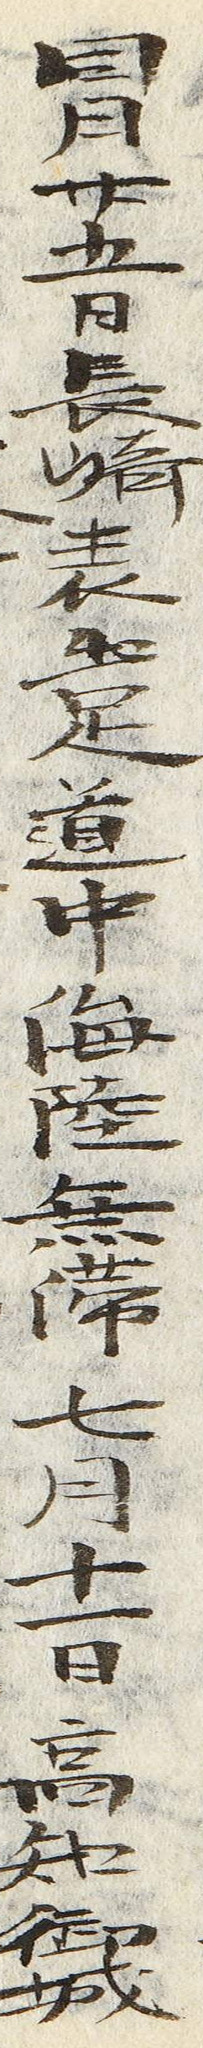同月廿五日長崎表出足道中海陸無滞七月十一日高知御城
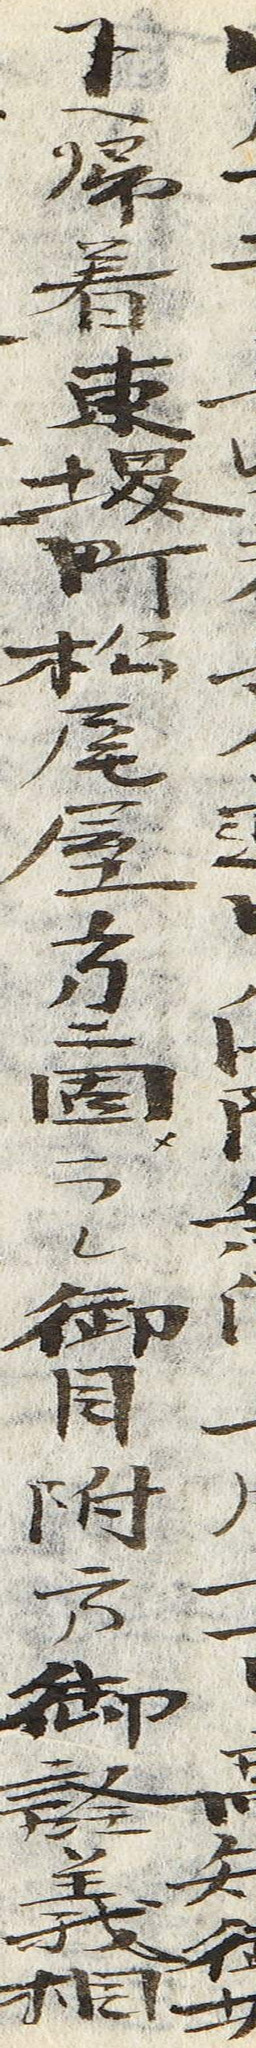下ヘ帰着東境町松尾屋方ニ固メラレ御目附方御詮議相
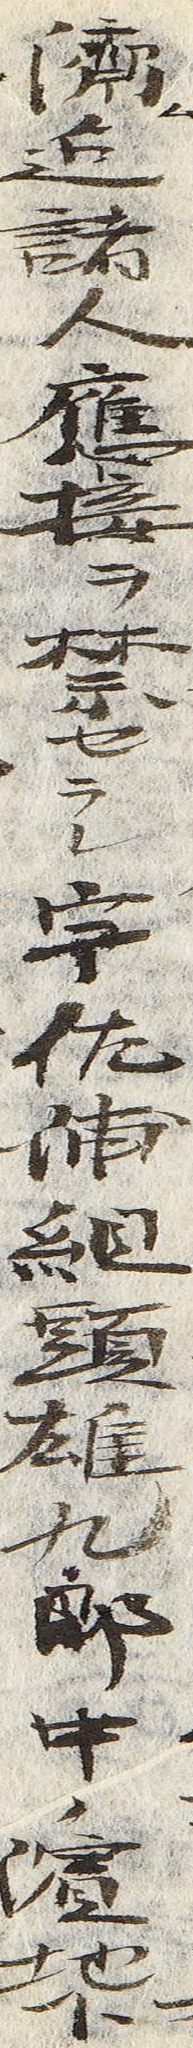済ム迄諸人応接ヲ禁セラレ宇佐浦組頭雄九郎中ノ浜地下
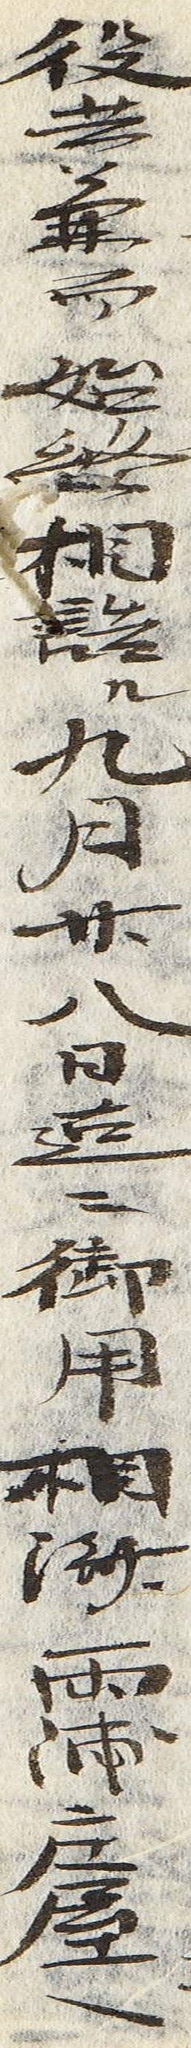役共兼而始終相詰ル九月廿八日迄ニ御用相済両浦庄屋へ
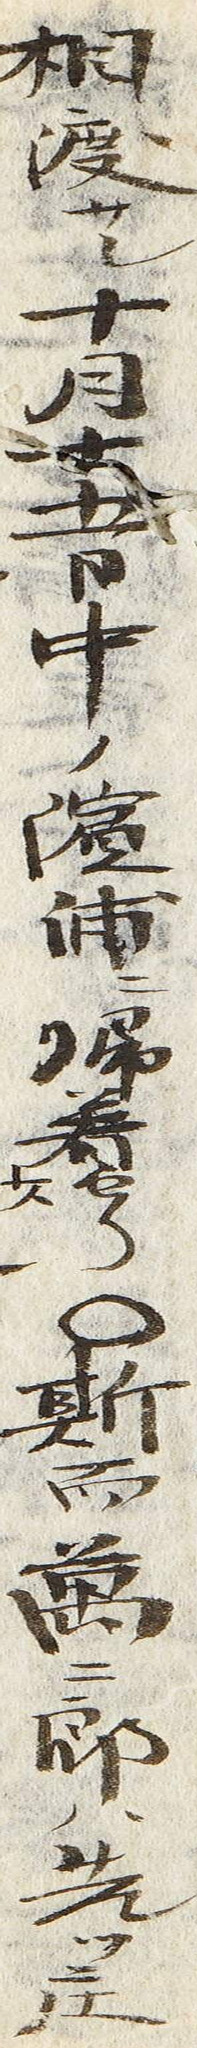相渡サレ十月十五日中ノ浜浦ニ帰着セリ〇斯而萬二郎ハ先ツ庄
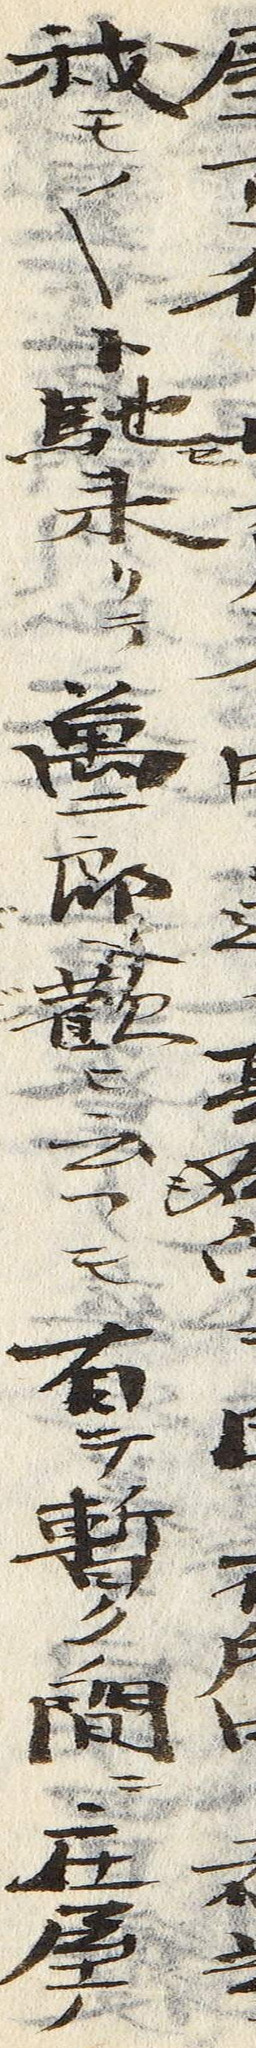我モ〳〵と馳セ来リテ萬二郎へ歓ヒ云フモ有テ暫クノ間庄屋ノ
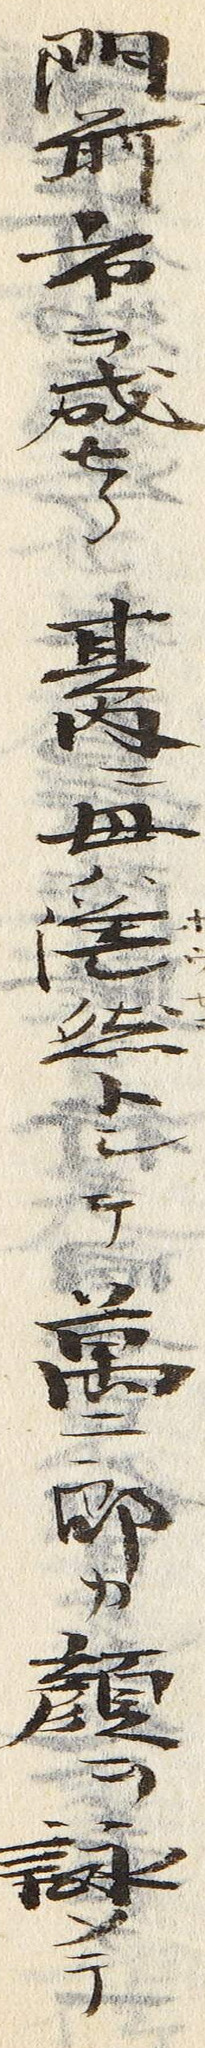門前市ヲ成セリ其内ニ母ノ茫然トシテ萬二郎カ顔ヲ詠メテ
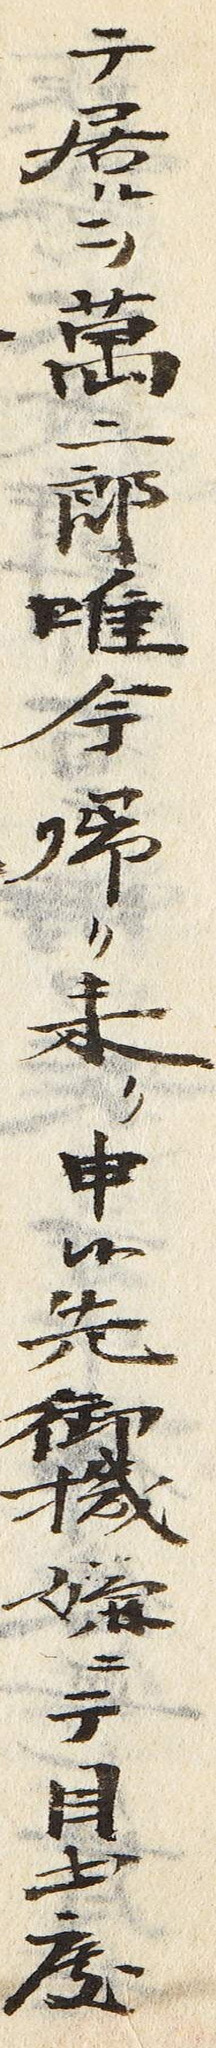テ居ルヲ萬二郎唯今帰リ来リ申候先御機嫌ニテ目出度
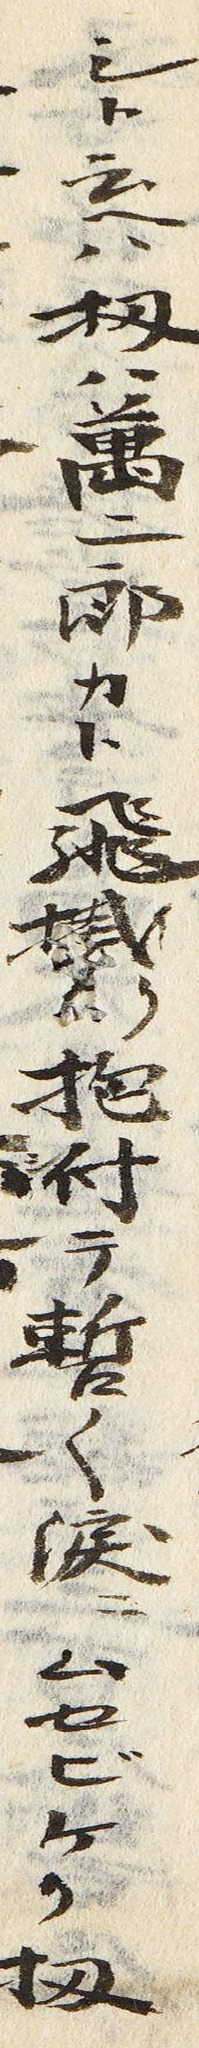シト云ヘハ扨ハ萬二郎カト飛掛リ抱付ヲ暫く涙ニムセビケリ扨
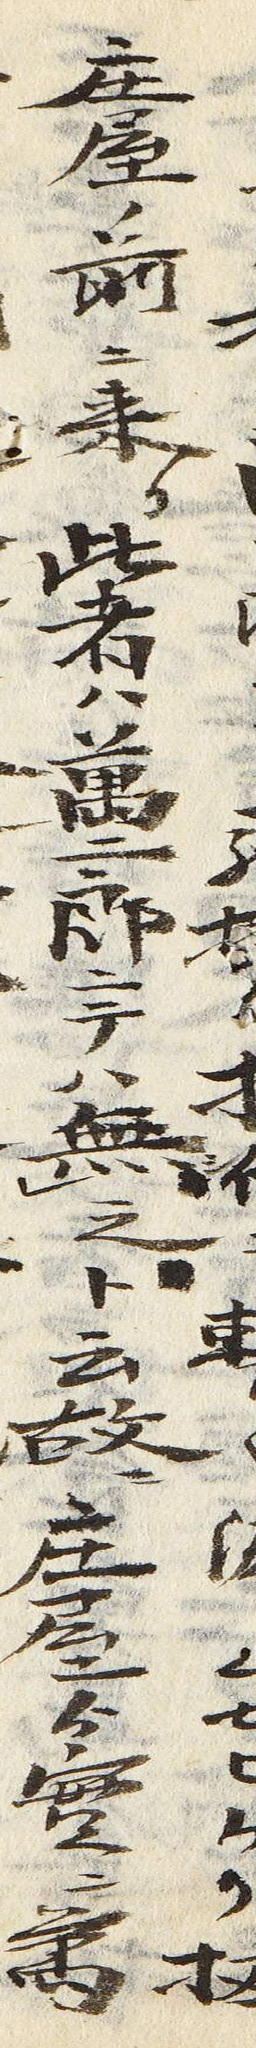庄屋ノ前ニ来リ此者ハ萬二郎ニテハ無之ト云故ニ庄屋ゟ実ニ萬
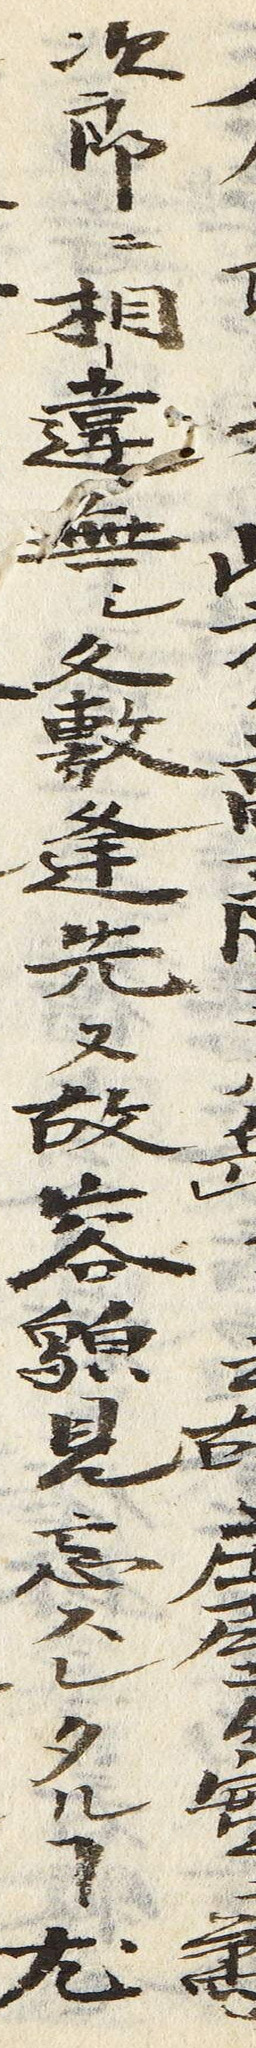次郎ニ相違無シ久敷逢先ヌ故容貌見忘スレタルヿ尤
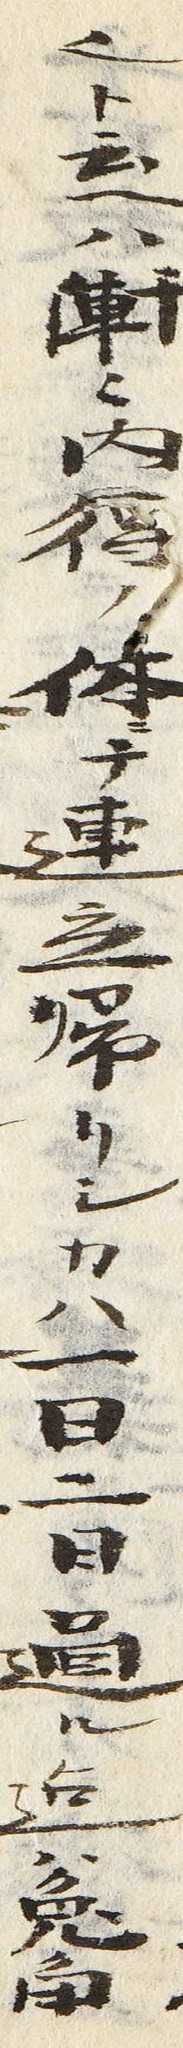也ト云へハ漸々内得ノ体ニテ連立帰リシカハ一日二日過ル迄ハ兎角
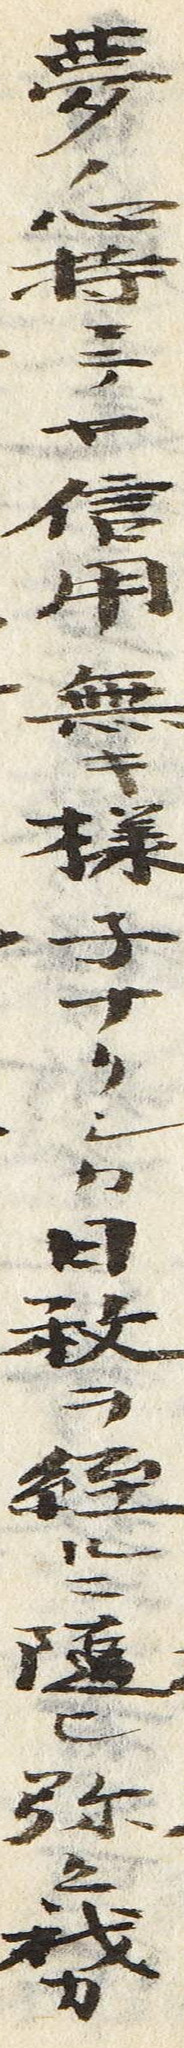夢ノ心地ニテヤ信用無キ様子ナリシカ日数ヲ経ルニ随ヒ弥々我カ
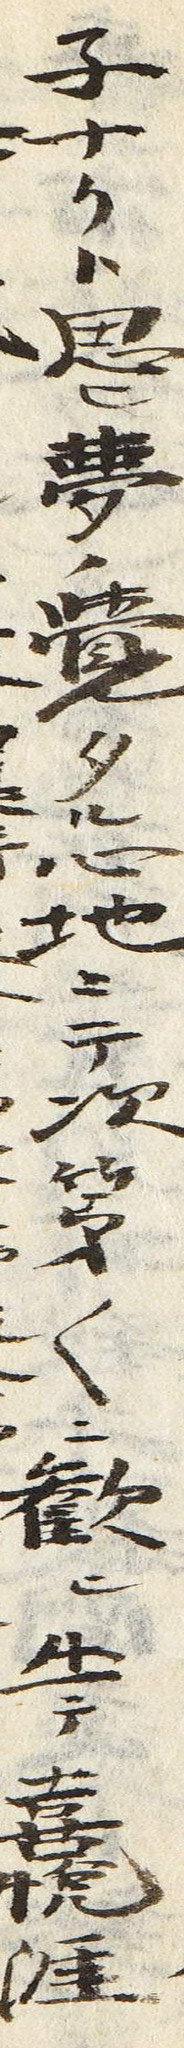子ナリト思ヒ夢ノ覚タル心地ニテ次第〳〵ニ歓ヒ生テ喜悦涯
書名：漂流記聞
